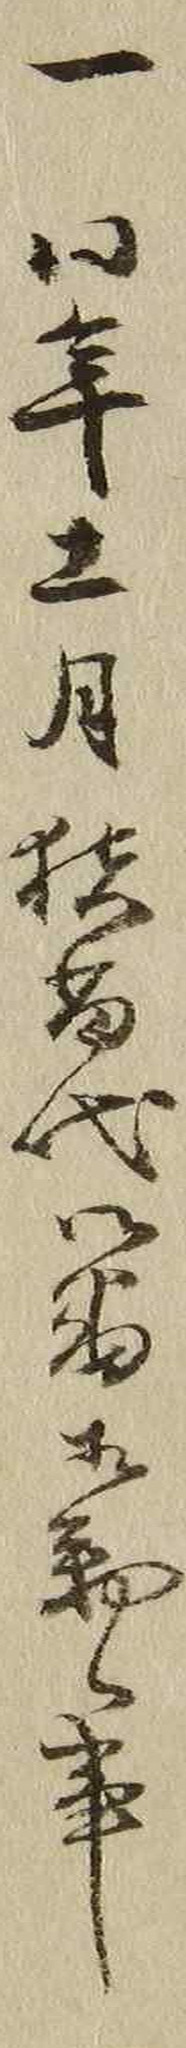一同年十一月猪苗代御番相勤候事
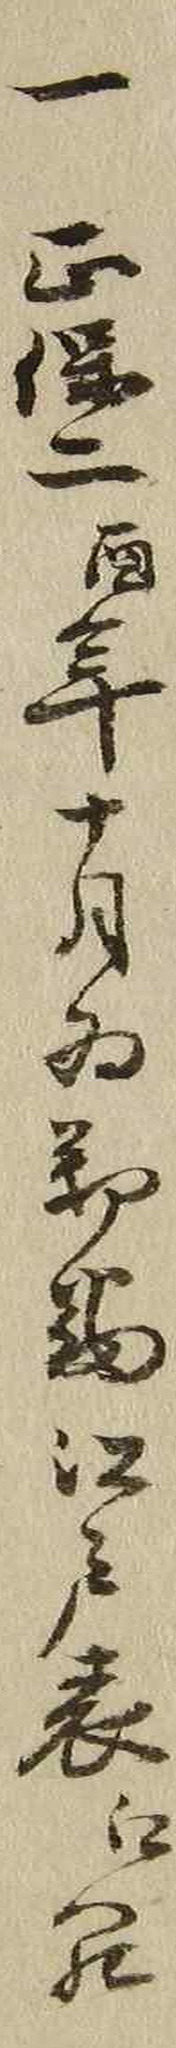一正保二酉年十月為勤番江戸表江罷
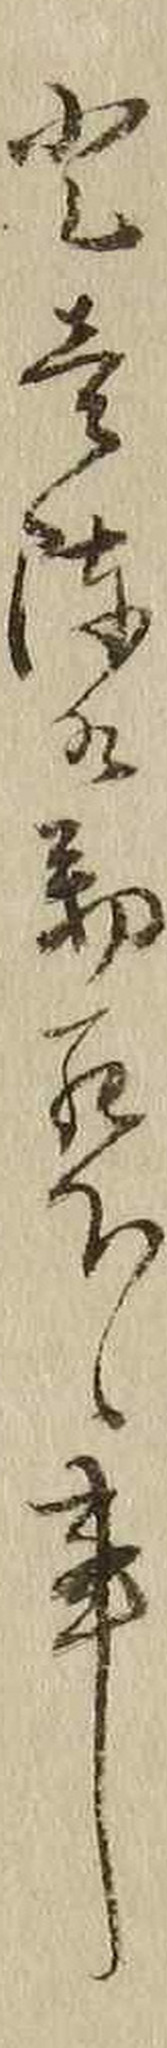登壱陣相勤罷下候事
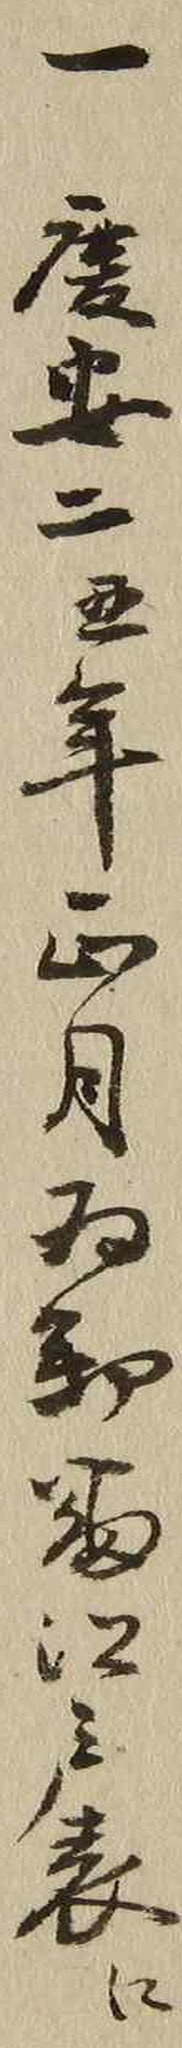一慶安二丑年正月為勤番江戸表江
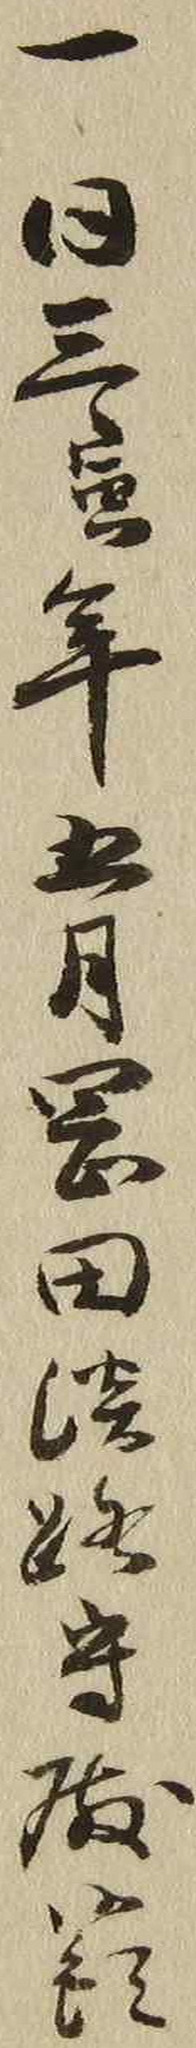一同三寅年五月岡田淡路守殿御願
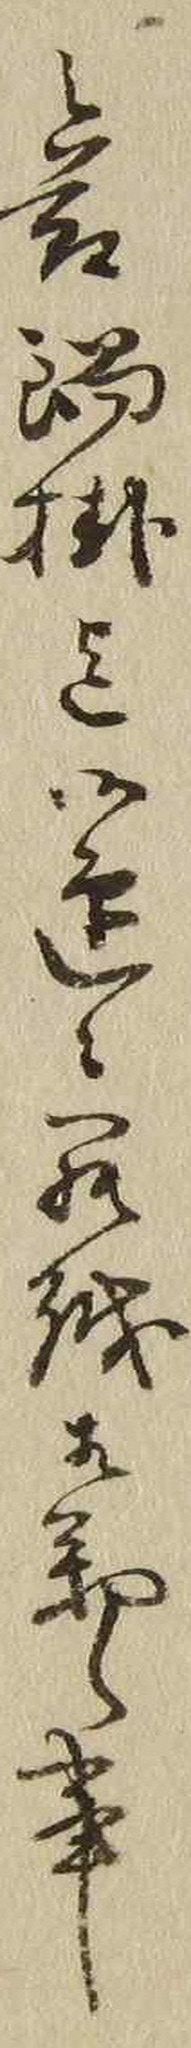之節鍋掛迄御迎ニ罷越相勤候事
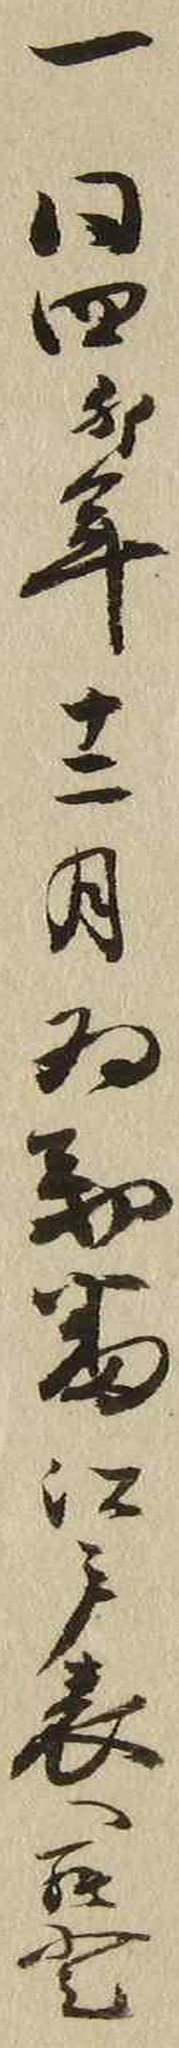一同四卯年十二月為勤番江戸表へ罷登
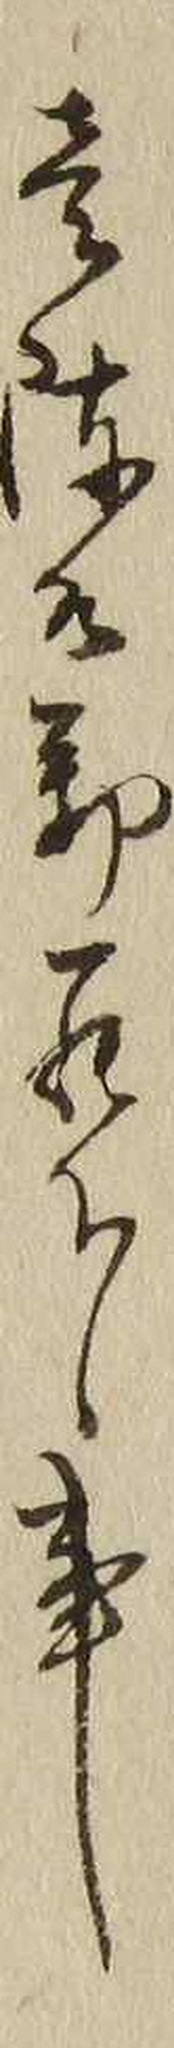登壱陣相勤罷下候事
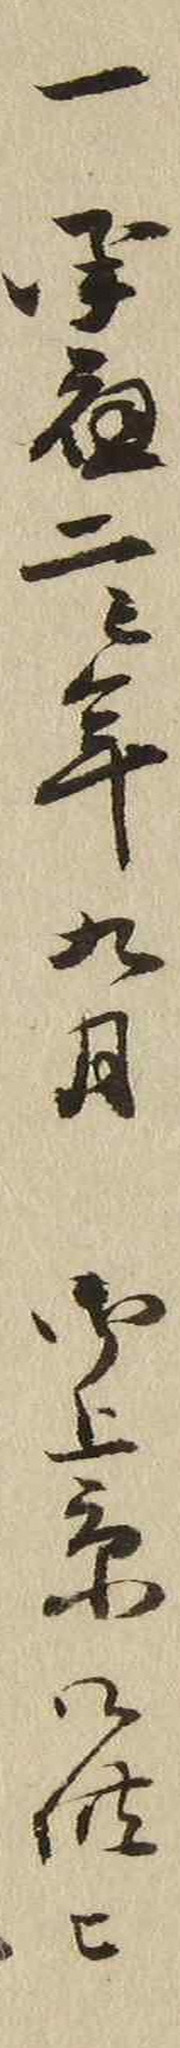一承応二巳年九月御上京御供被
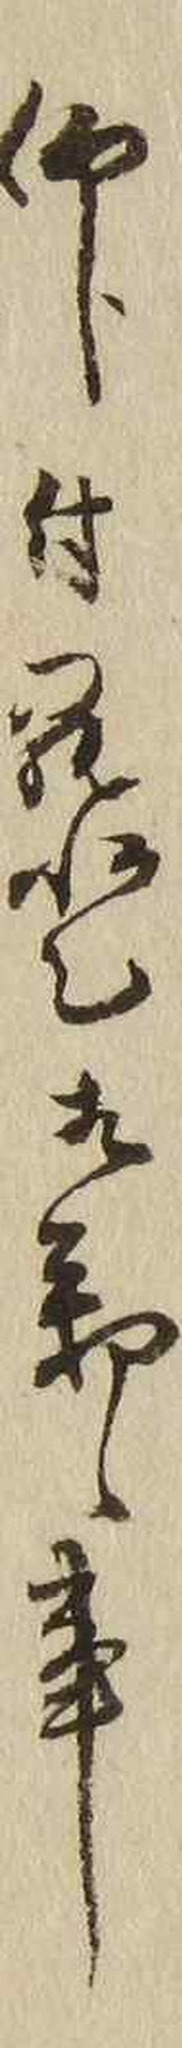仰付罷登相勤候事
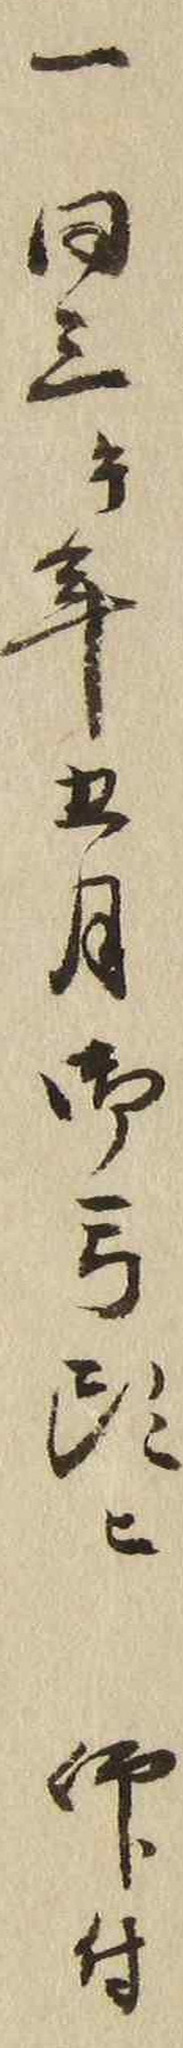一同三午年五月御弓頭被仰付

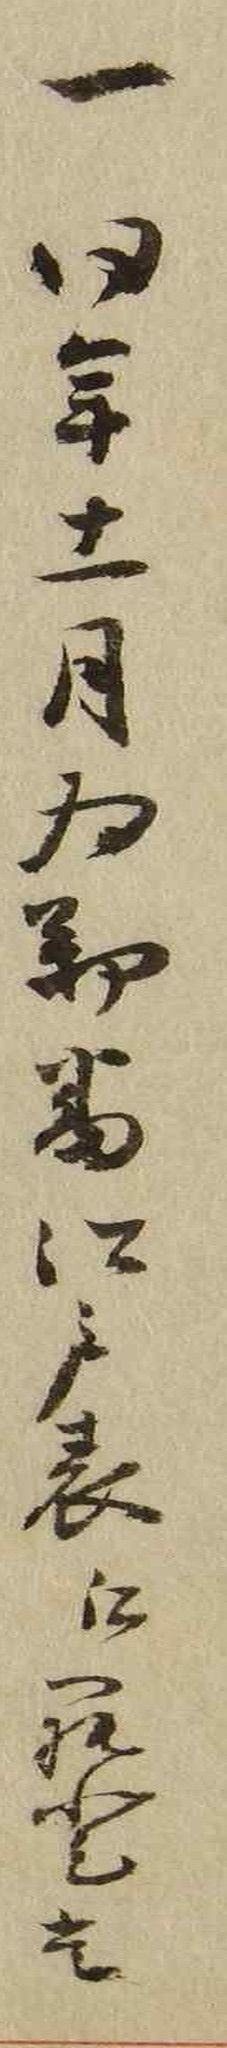一同年十一月為勤番江戸表江罷登壱
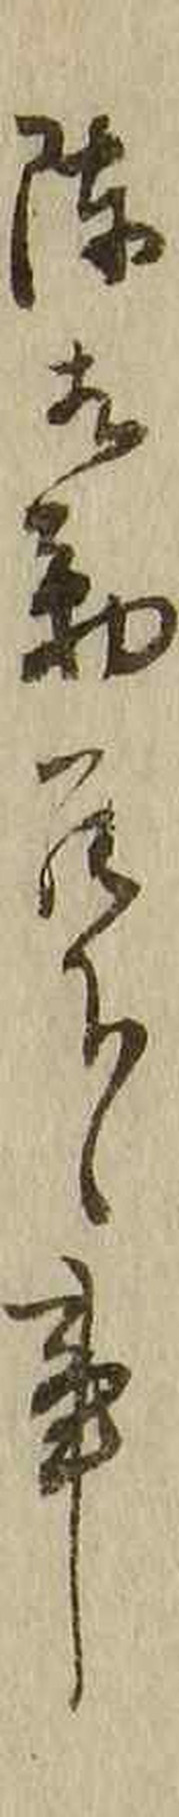陳相勤罷下候事
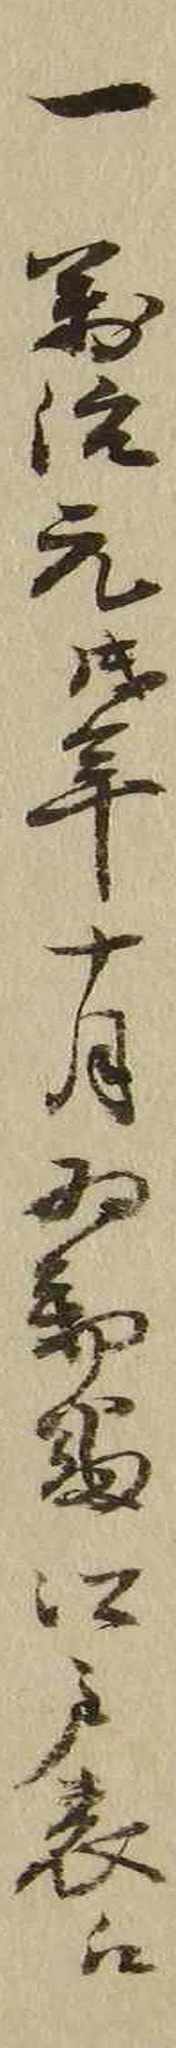一万治元戌年十月為勤番江戸表江
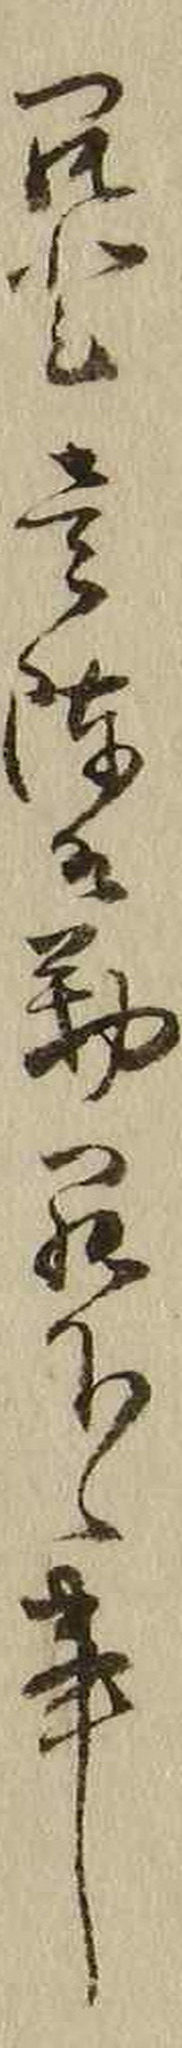罷登壱陣相勤罷下候事
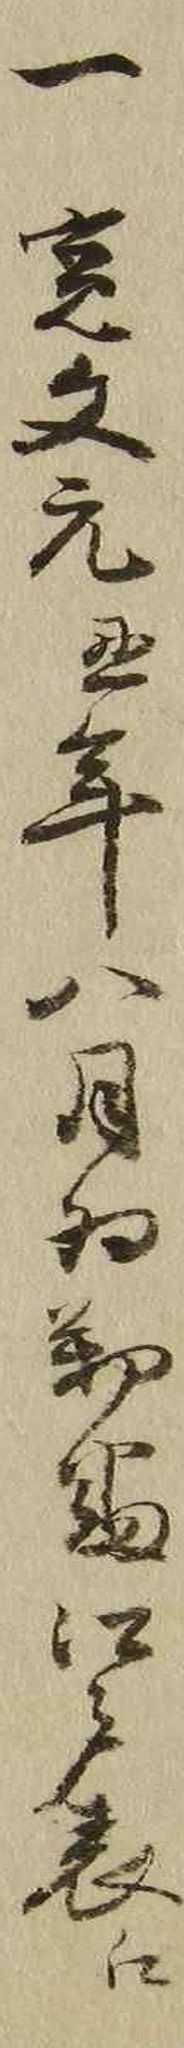一寛文元丑年八月為勤番江戸表江
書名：諸士系譜　巻之232　け之部1
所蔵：会津若松市立会津図書館
